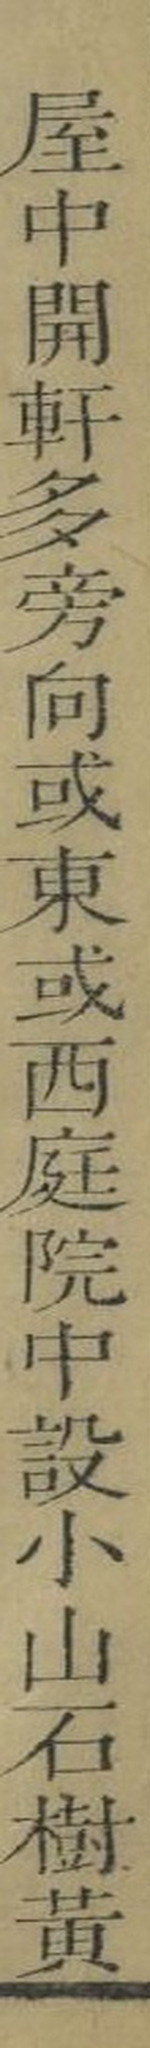屋中開軒多旁向或東或西庭院中設小山石樹黄
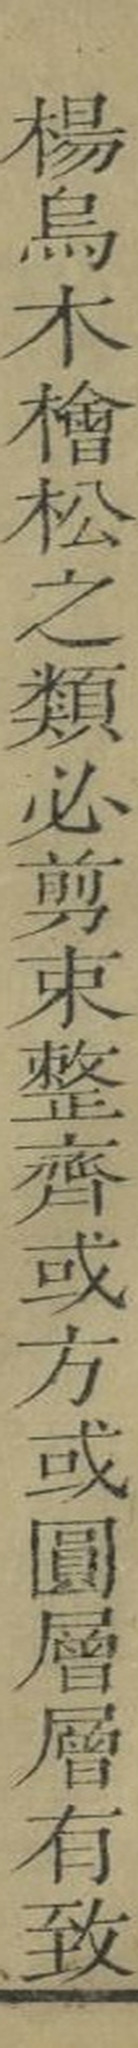楊烏木檜松之類必剪束整斉或方或円層層有致
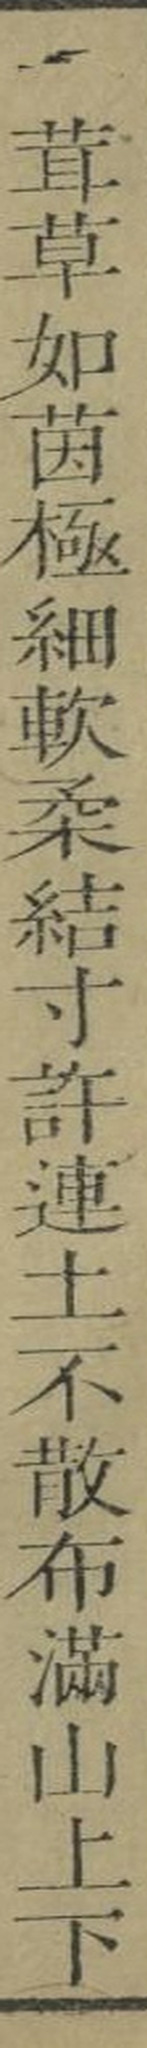茸草如茵極細軟柔結寸許連土不散布満山上下
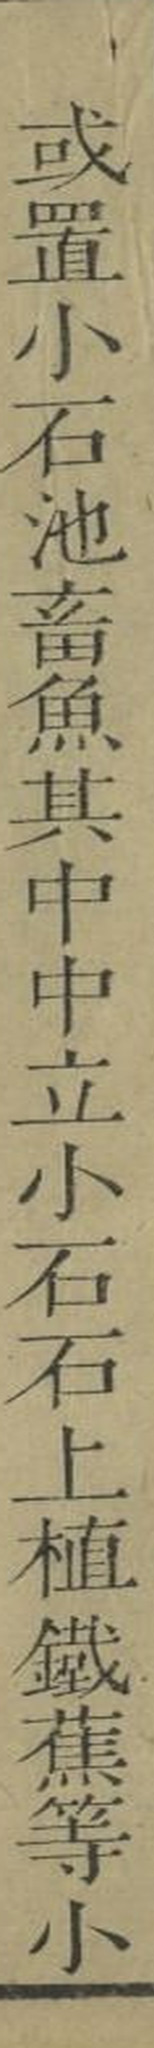或置小石池畜魚其中中立小石石上植鉄蕉等小
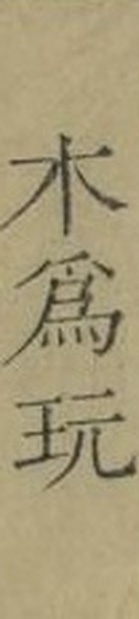木為玩
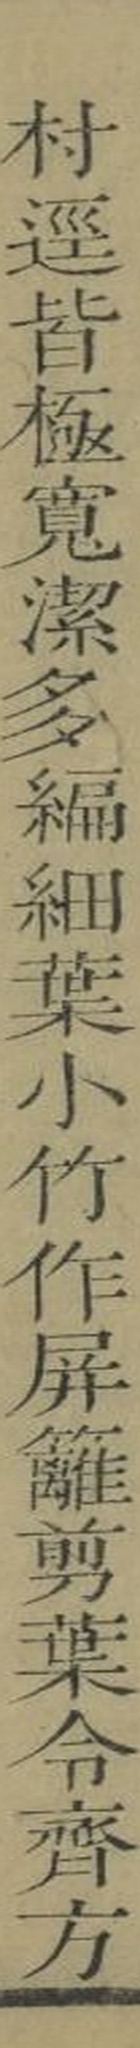村逕皆極寛潔多編細葉小竹作屛籬剪葉令斉方
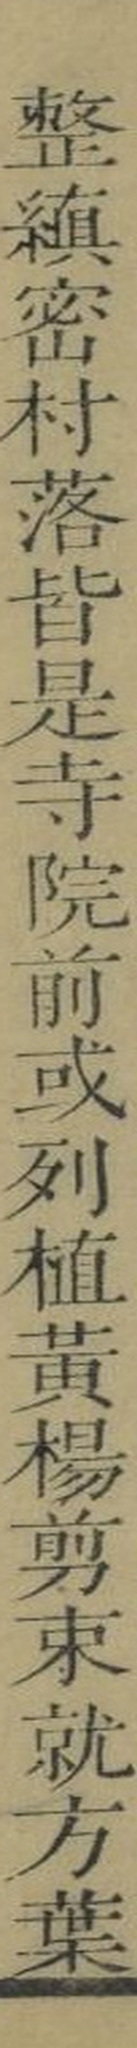整縝密村落皆是寺院前或列植黄楊剪束就方葉
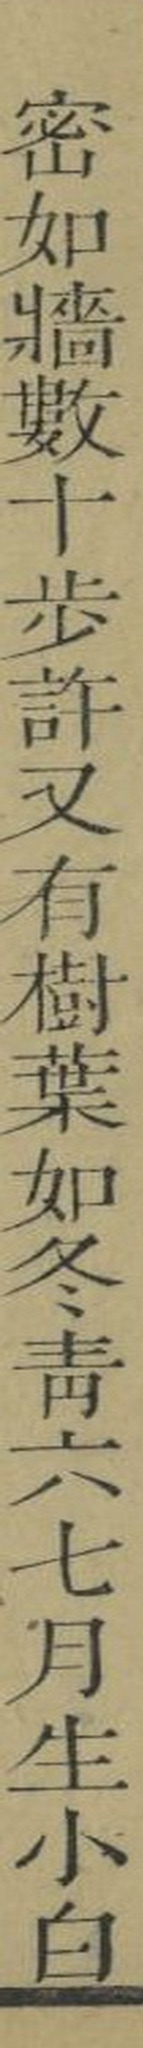密如牆数十歩許又有樹葉如冬青六七月生小白
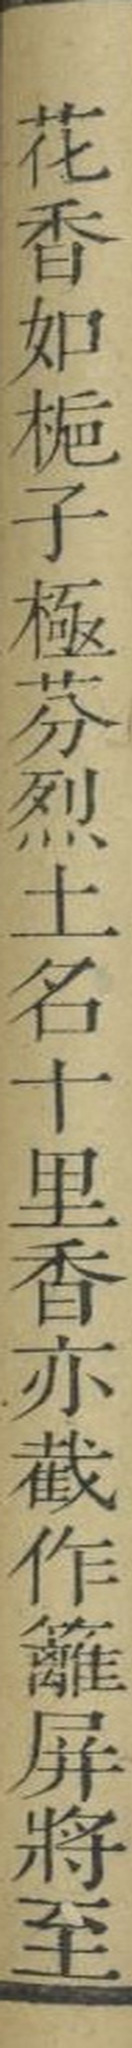花香如梔子極芬烈土名十里香亦截作籬屛将至
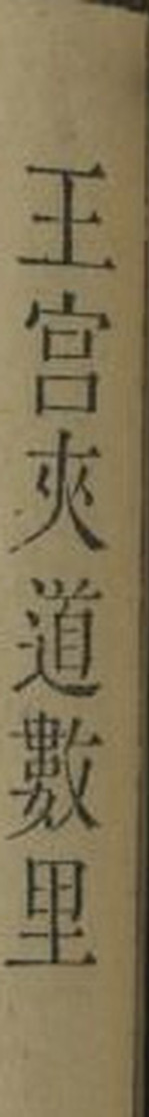王宮夾道数里
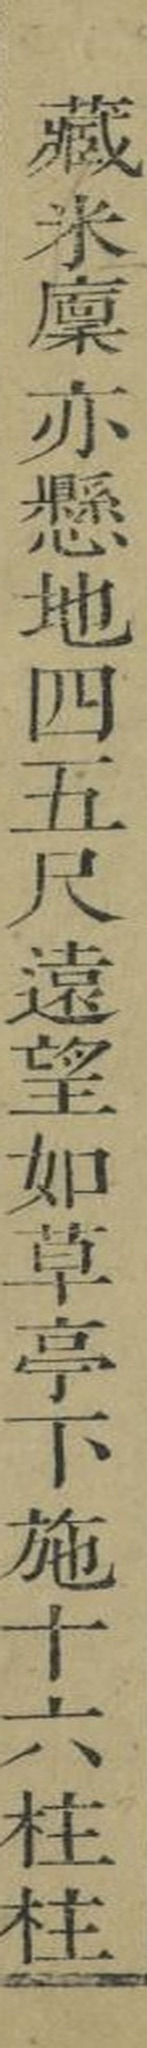蔵米廩亦懸地四五尺遠望如草亭下施十六柱柱
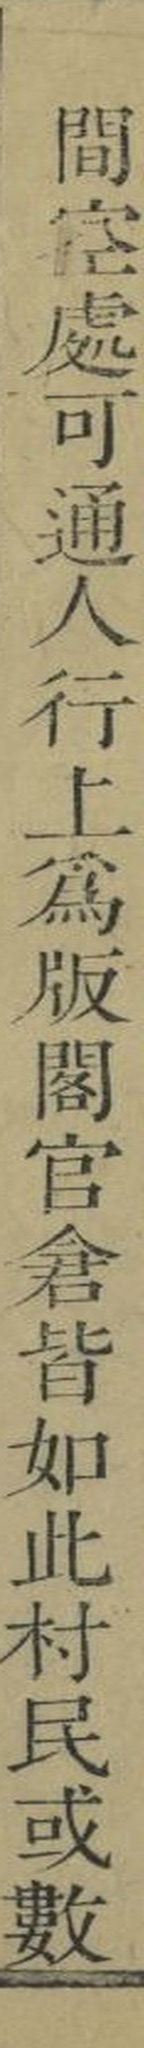間空処可通人行上為版閣官倉皆如此村民或数
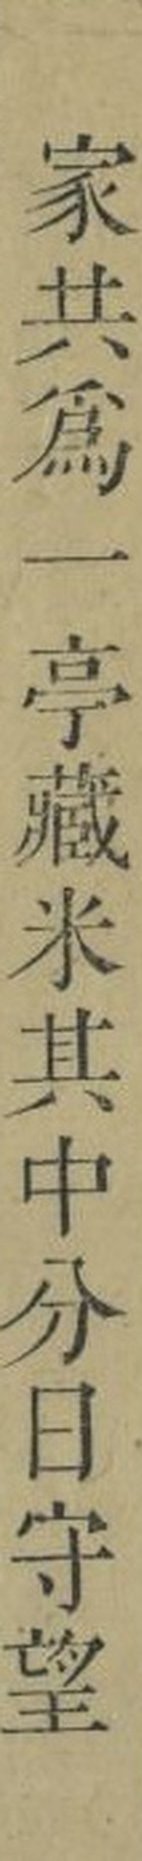家共為一亭蔵米其中分日守望

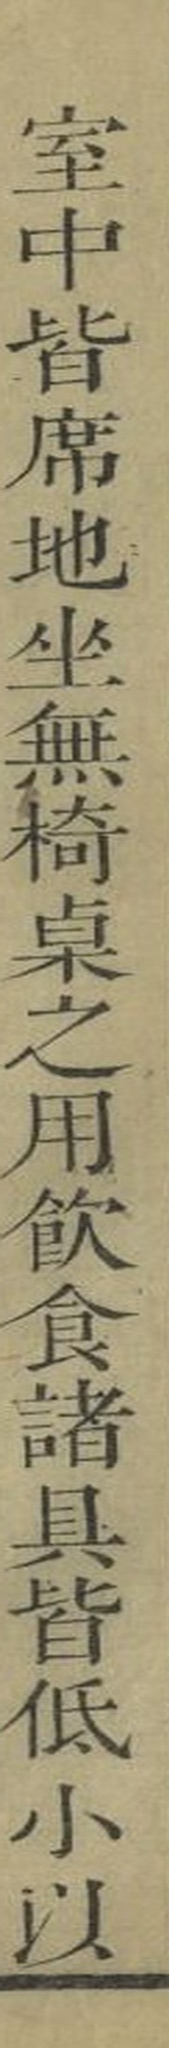室中皆席地坐無椅桌之用飲食諸具皆低小以
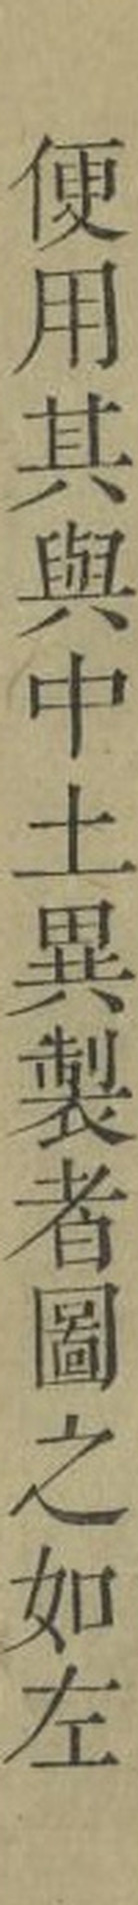便用其与中土異製者図之如左
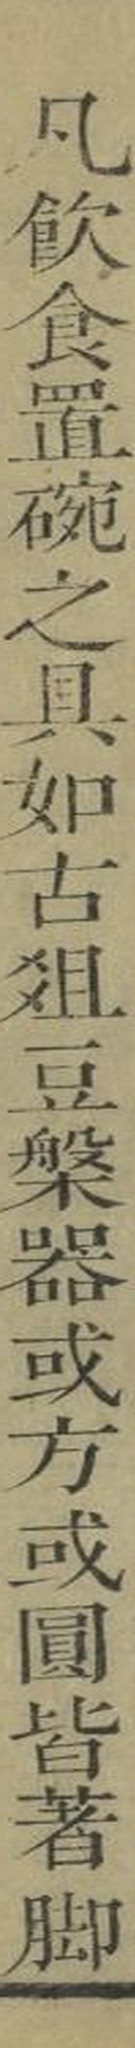凡飲食置碗之具如古俎豆槃器或方或円皆著脚
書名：中山伝信録 巻六
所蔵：University of the Ryukyus Library
